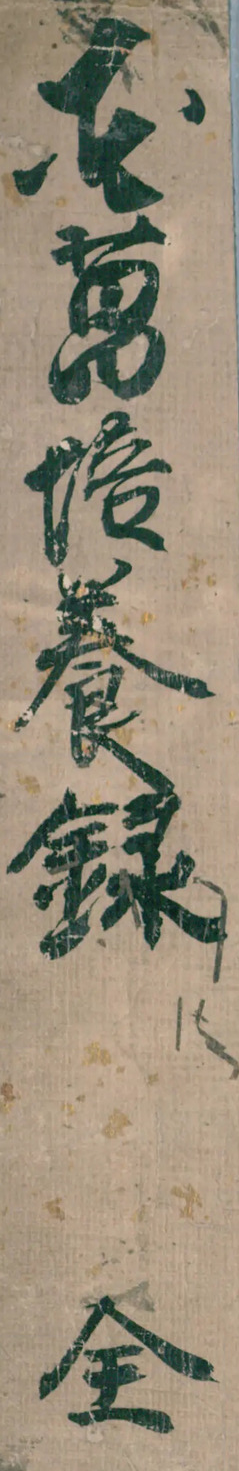花菖蒲培養録全

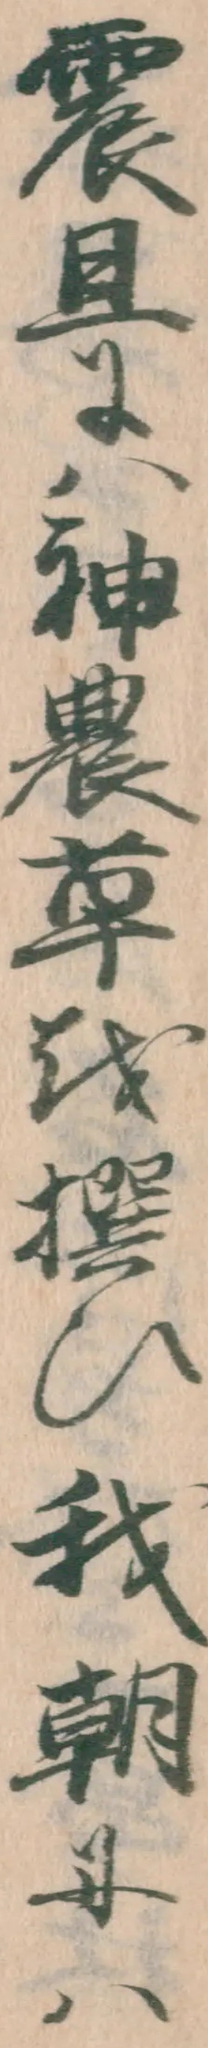震旦には神農草を撰ひ我朝には
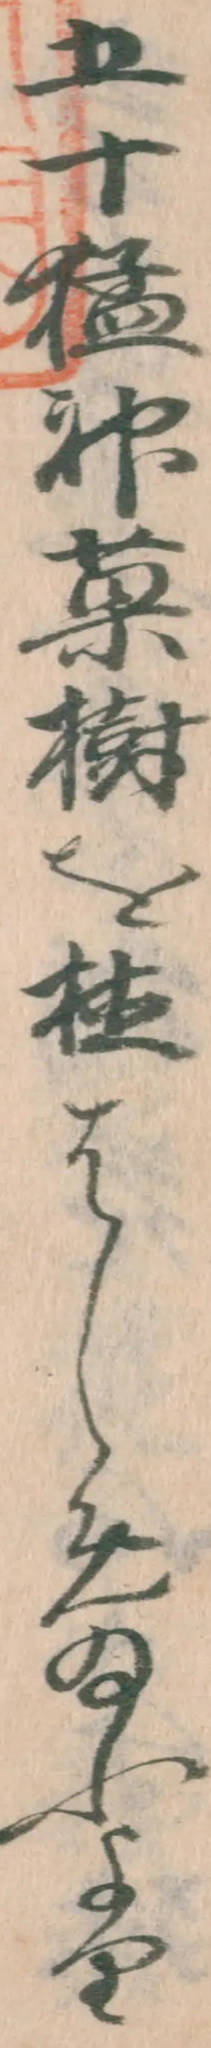五十猛神果樹を植はしめ給ふより
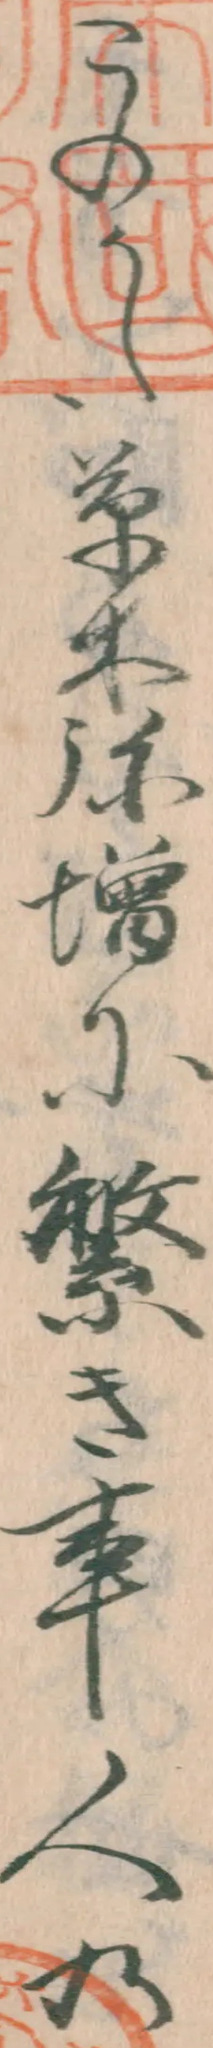このかた草木弥増に繫き事人の
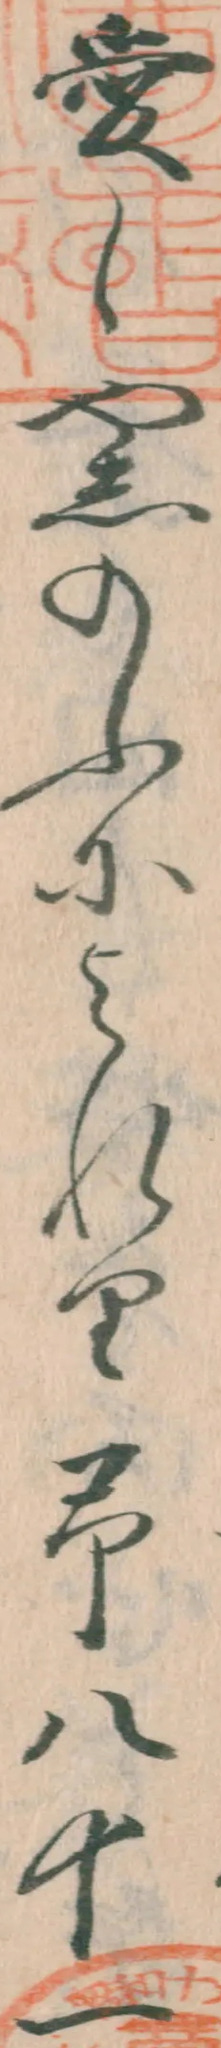愛しやしのふによれり予八十一
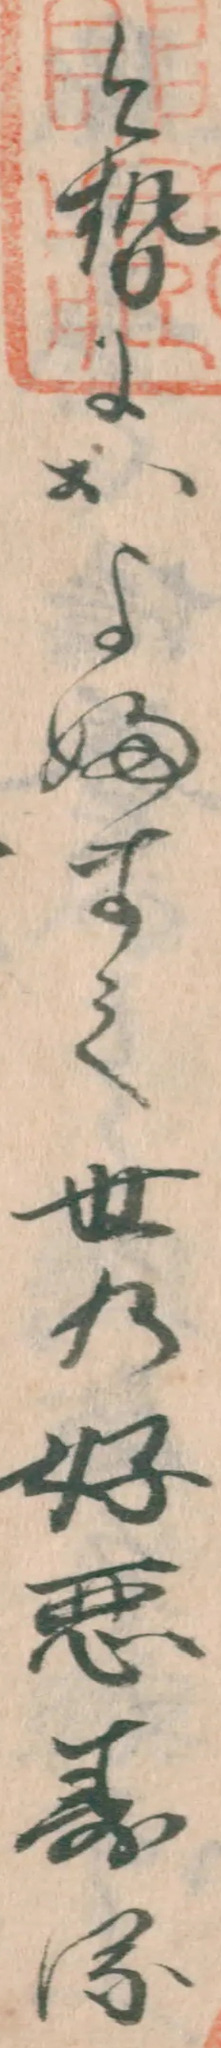今勢におよふまて世の好悪する
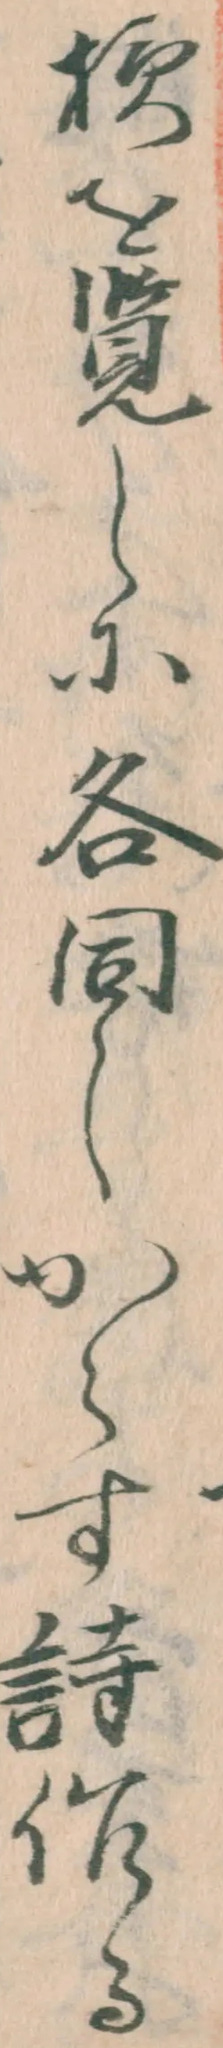梗を覧しに各同しからす詩作る
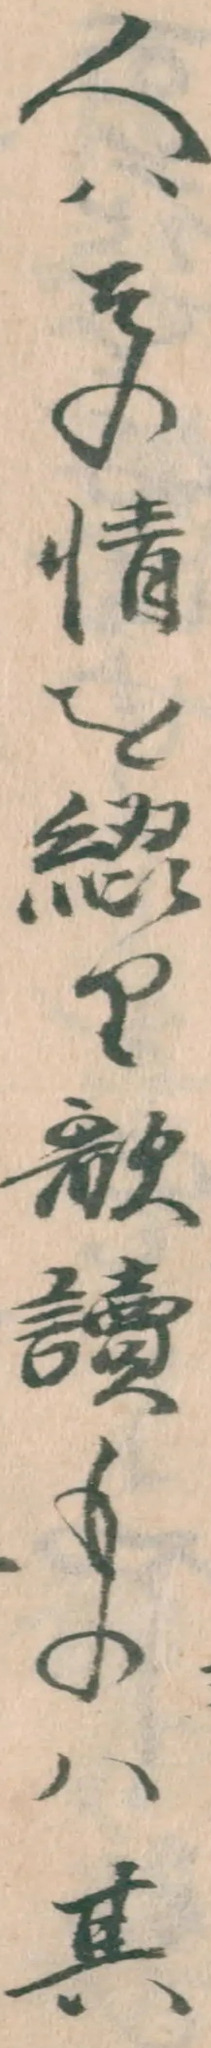人はその情を綴り歌読ものは其
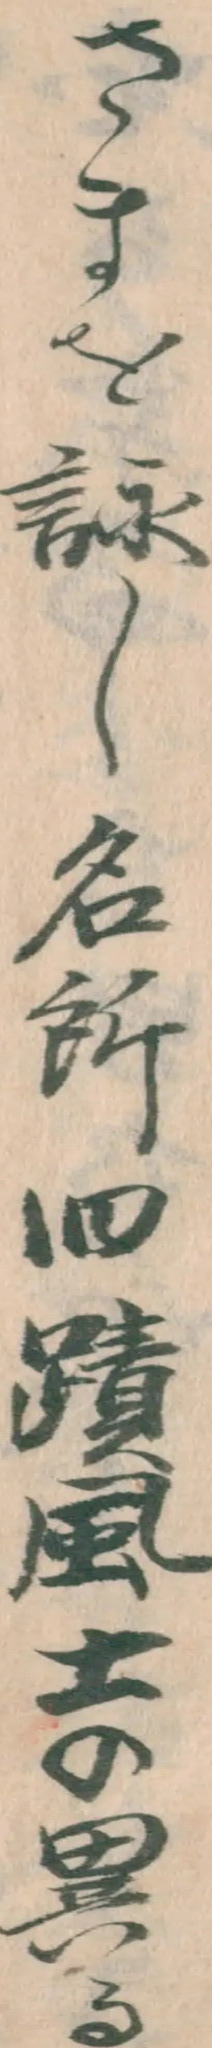さまを詠し名所旧蹟風土の異る
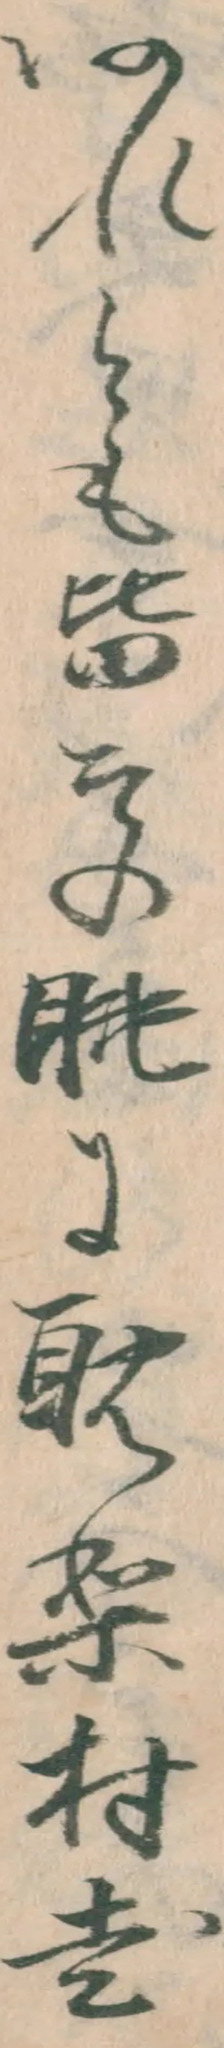あれとも皆その眺に耽架村走

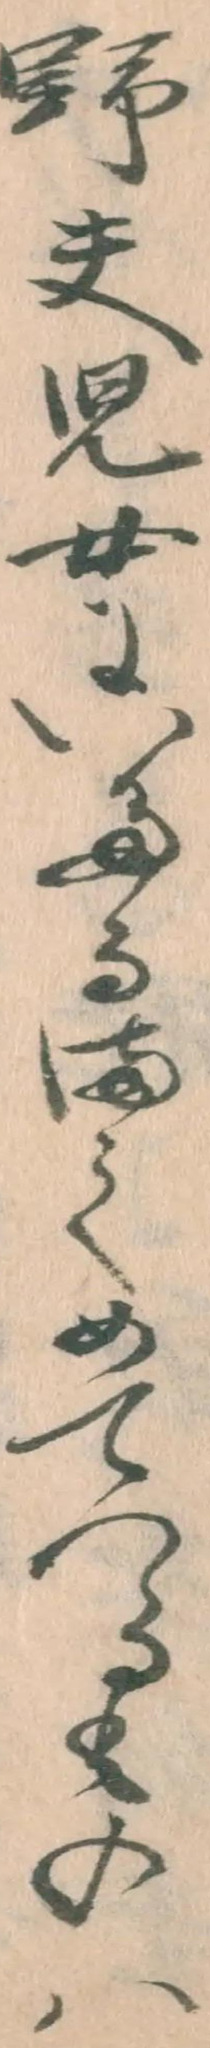野夫児女にいたるまてめてつるもの
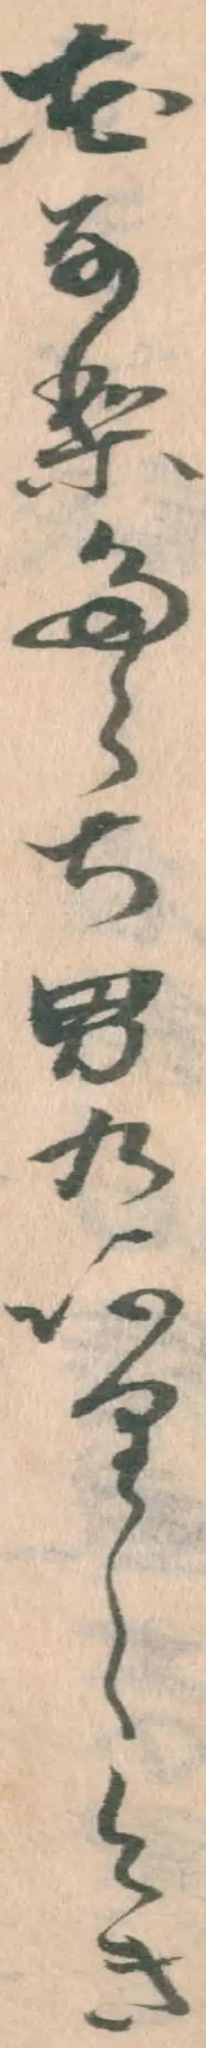花なりたゝち男のありしとき
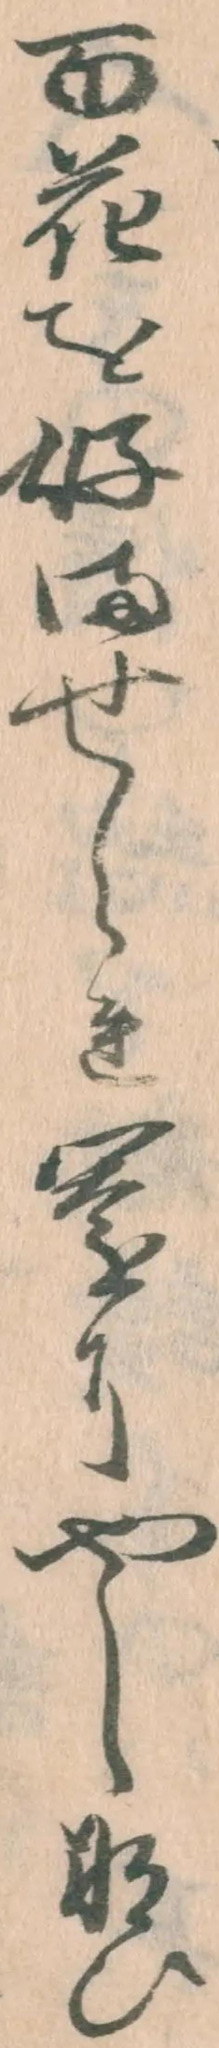百花を好ませられ遂にやしなひ
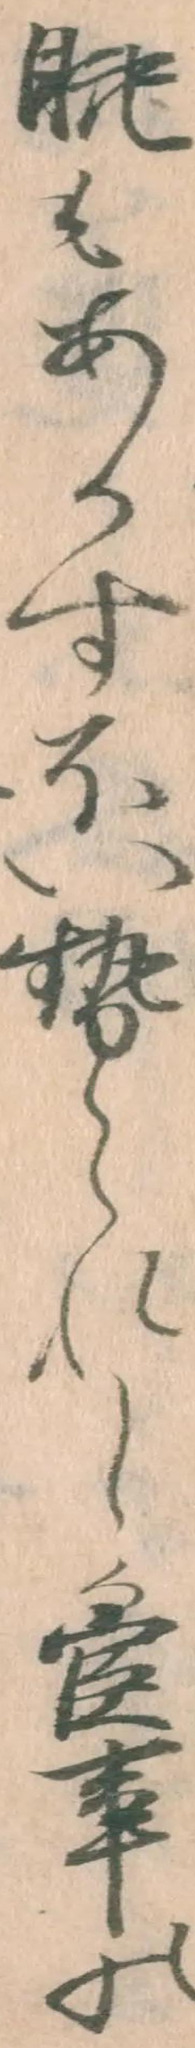眺もあかすほいせられしに宦事の
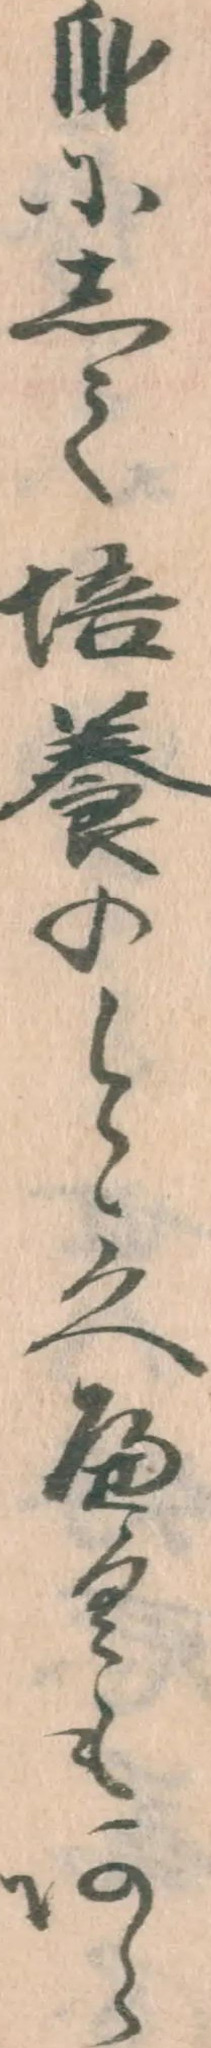身にして培養のこゝろへべくもあら
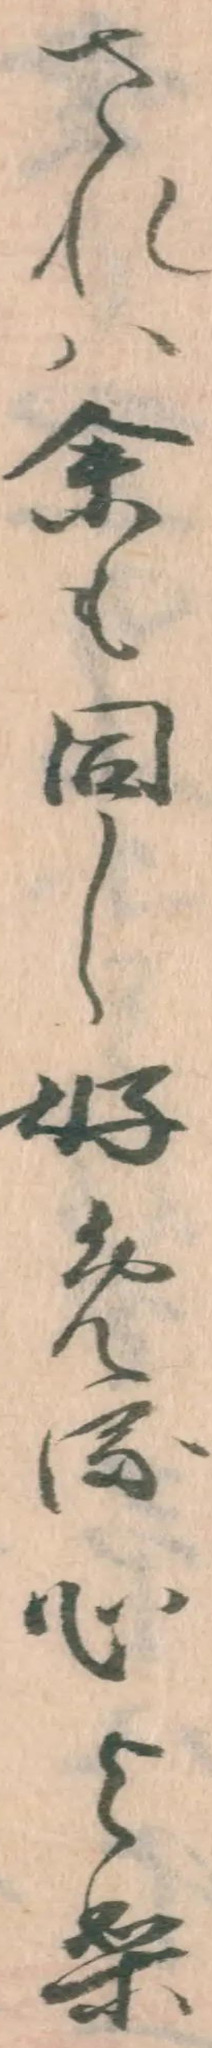されは余も同しく好める心より
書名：花菖培養録
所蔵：国立国会図書館 National Diet Library, JAPAN
